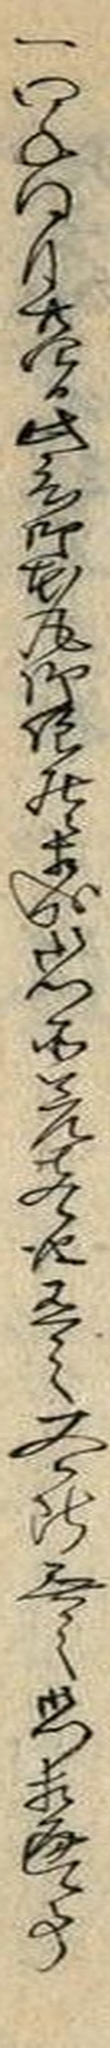一同年同月廿四日此度御本丸御住居に相成御門所差支候儀有之又ハ断無之御門相通候事
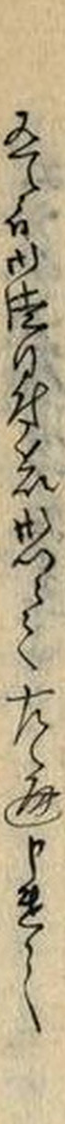有之候に付御徒目付を以御門々々へ左之通申遣之
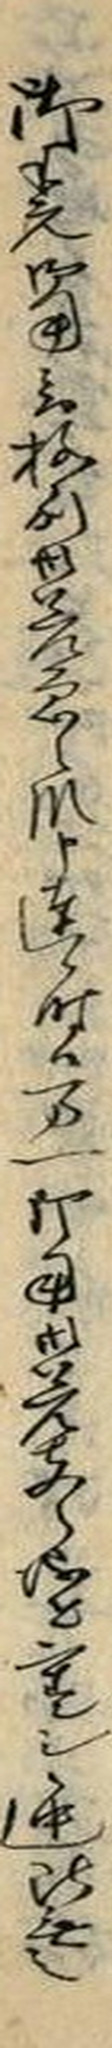御手元御用に而格別御差急候段申達候時は万一御用差支之儀と重れし候迚断無之

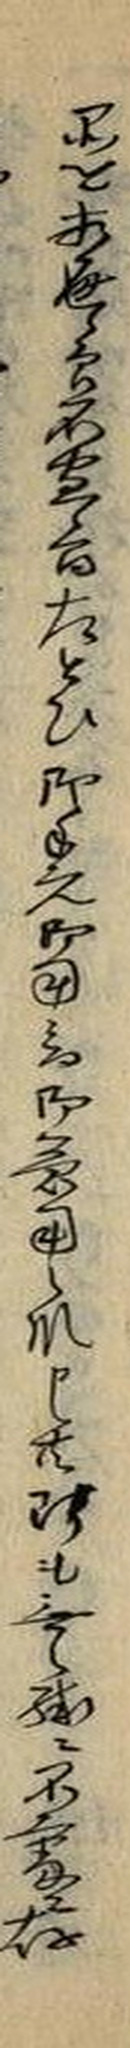品を相通候而は不宜候間たとひ御手元御用に而御急用之段申候共断も無之殊に不審に存
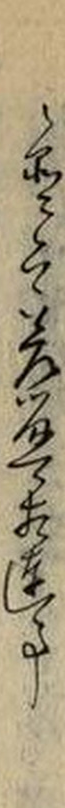候品に候はゝ差留可相達候事
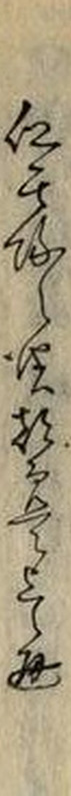但其帰之儀都而是迄之通
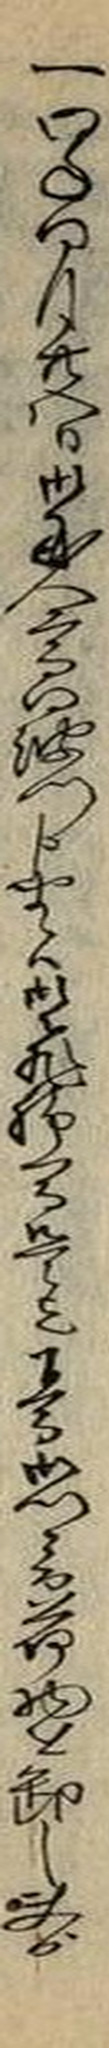一同年四月廿八日御用人高田波門申聞候は御飛脚馬是迄下馬御門に而荷物を卸し夫ゟ
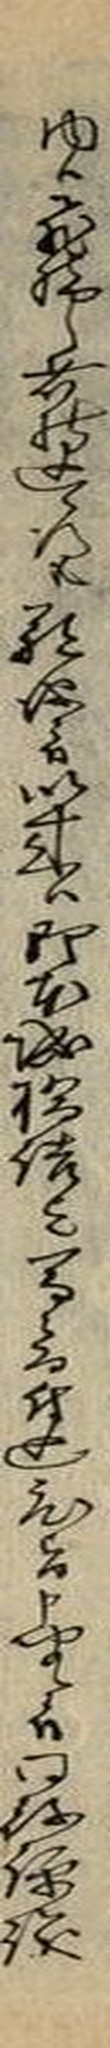内江は飛脚之者持込候得共難儀に付以来は御本城橋詰迄馬に而付込度旨申聞候に付同役評議
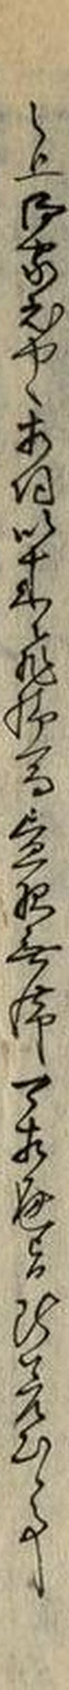之上御家老中へ相伺以来飛脚馬昼夜無滞可相通旨断差出候事
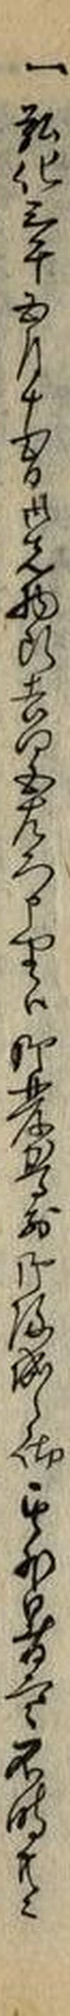一弘化三午五月十五日御先物頭吉田五左衛門申聞候は御発駕前御帰城之砌其外暑寒不時共に
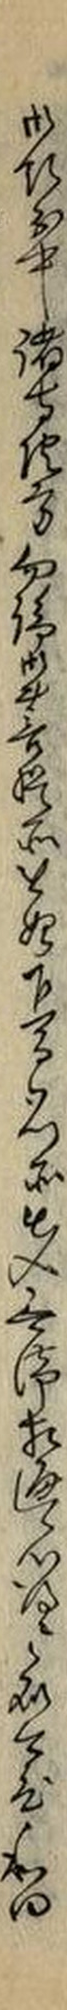御領分中諸寺院方勿論御菩提所を始下馬御門所出入無滞相通候心得に候処今度和田
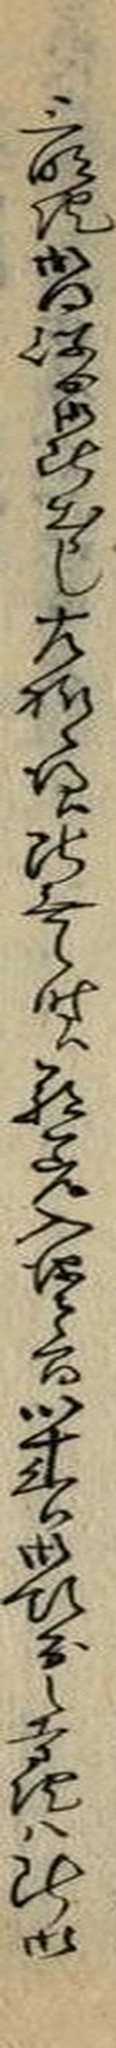三明院御同役ゟ御断出申候左様候得は断無之時は難差入儀に候間以来は御領分之寺院は断御
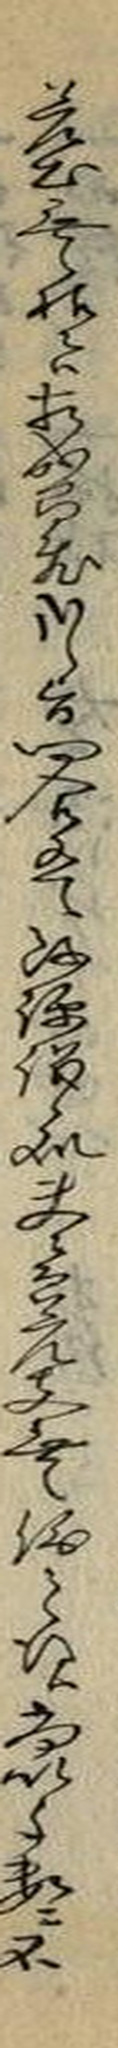差出無之候様には相成間敷哉之旨問合有之致評論候処夫々に而差支無之儀に候得は尚以手数に不
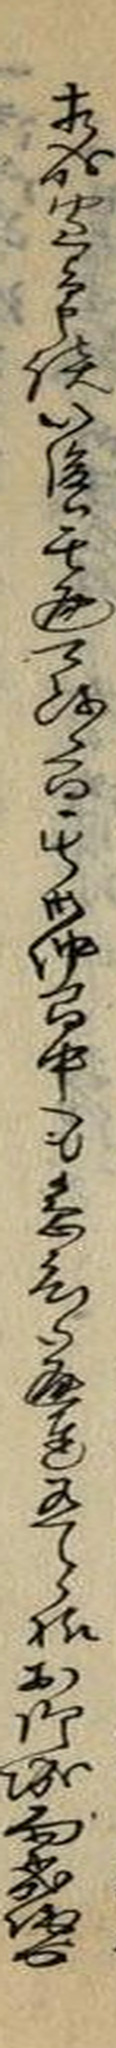相成宜旨申談以後は其通可致候間其御仲間中へも急度御通達有之候様於御城雨森儀右衛門
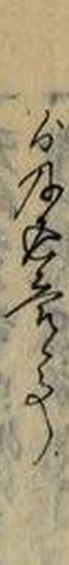ゟ及返答候事
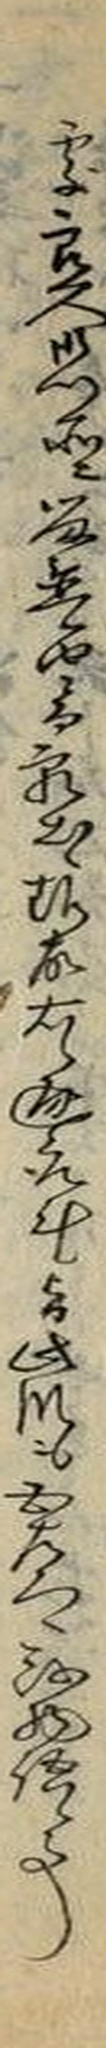処良久御門所に留置候由に而願出候趣故右之通取斗候旨此段も五左衛門へ致物語候事
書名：御門御櫓之部
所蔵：福井県文書館 Fukui Prefectural Archives
